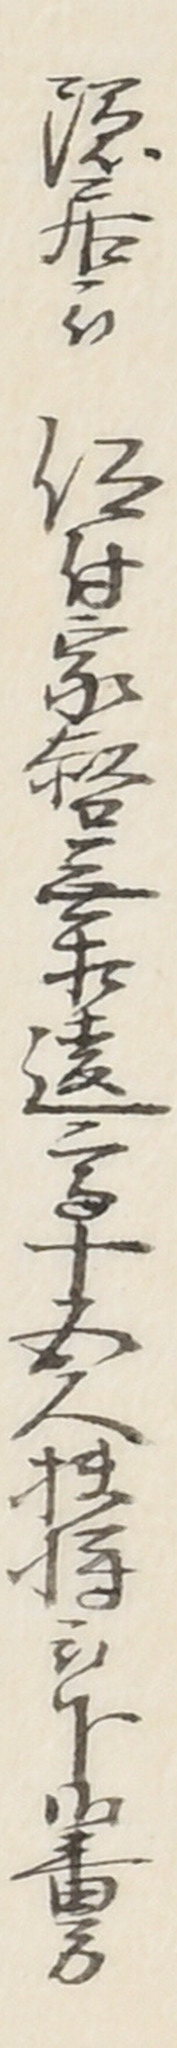隠居被仰付家督無相違高十五人扶持被下御番方
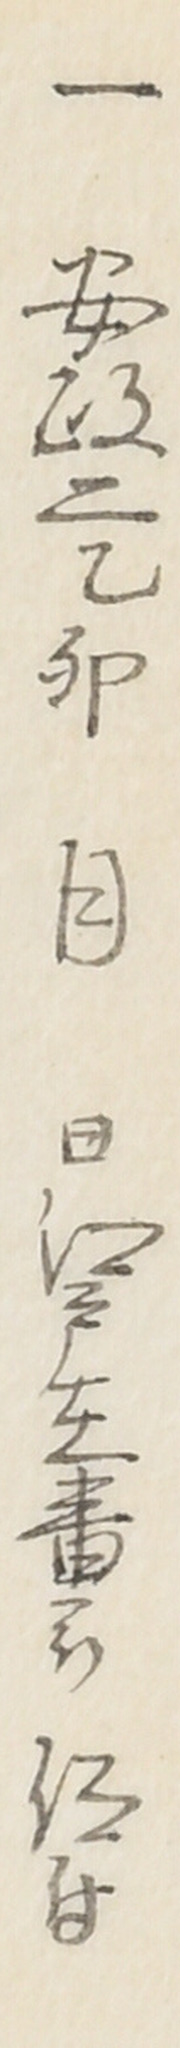一安政二乙卯月日江戸在番被仰付
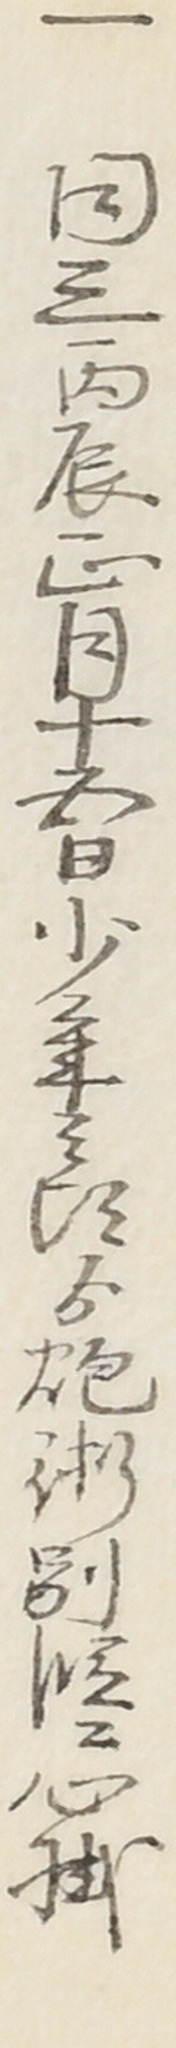一同三丙辰正月十五日少年之頃ゟ炮術別段ニ心掛
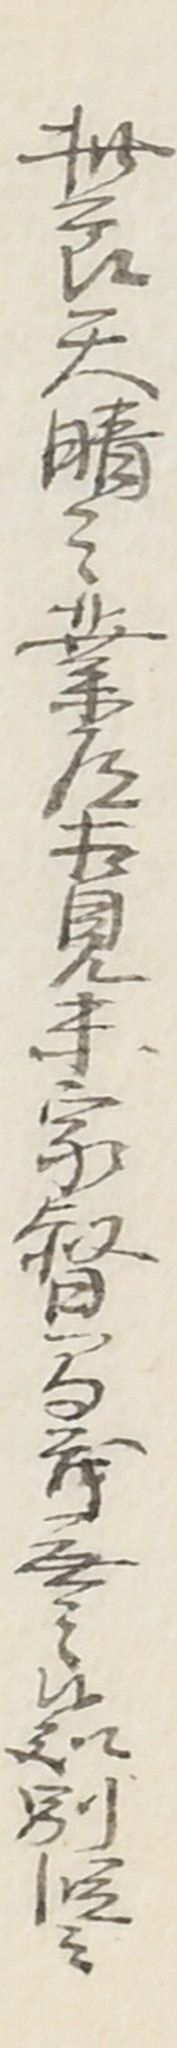此節天晴之業道相見未家督間も無之候処別段之
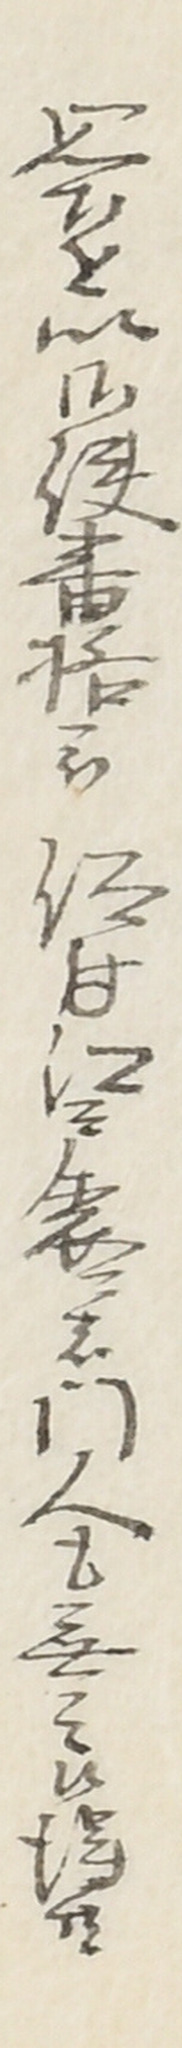思召を以御使番格被仰付江戸表ニは門人も無之候得共
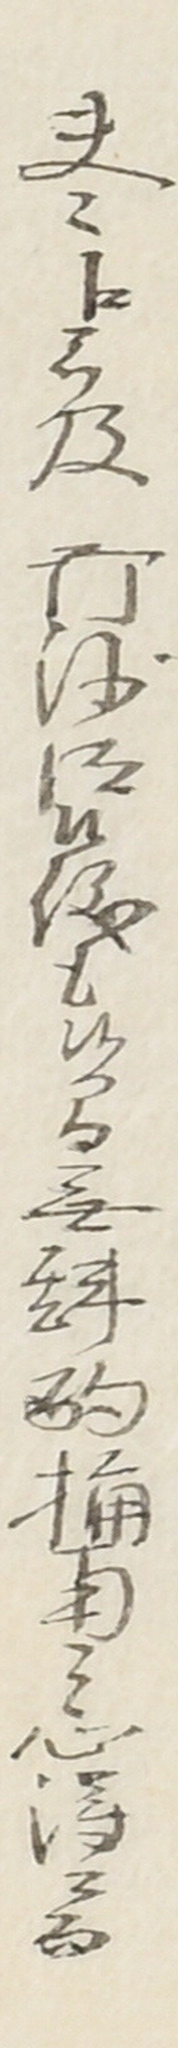夫々江被及御沙汰候儀も候間無斟酌指南之心得ニ而

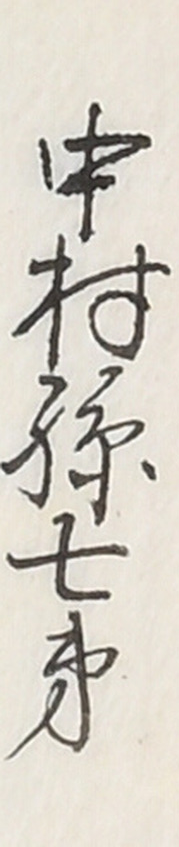中村孫七弟
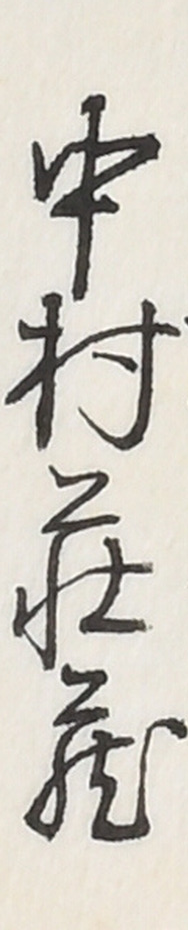中村荘蔵
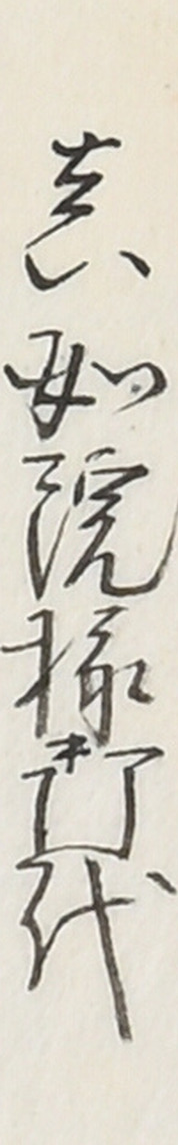真如院様御代
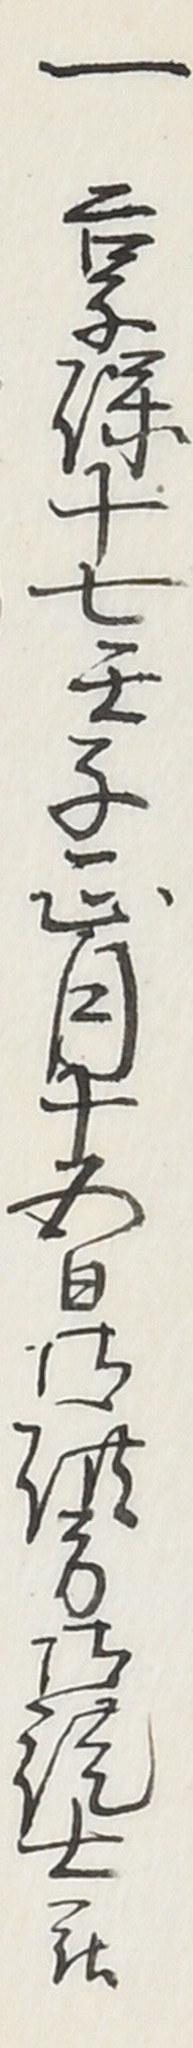一享保十七壬子正月十五日御供方御徒士被
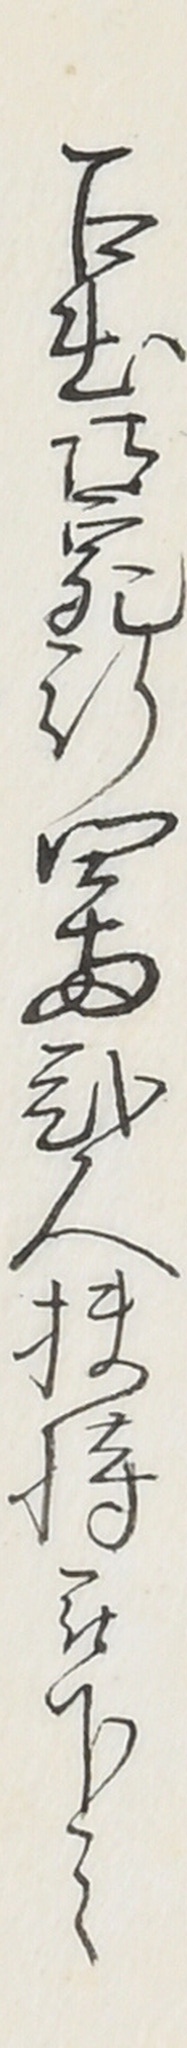召出御宛行四両弐人扶持被下之
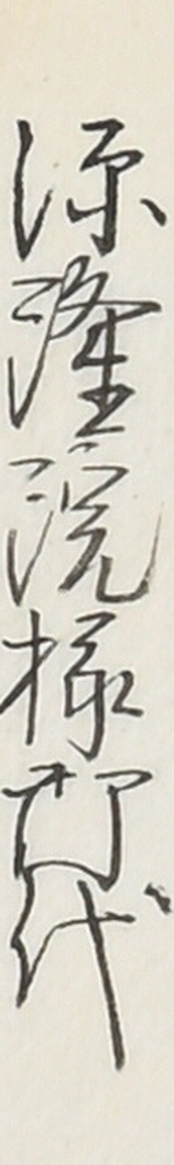源隆院様御代
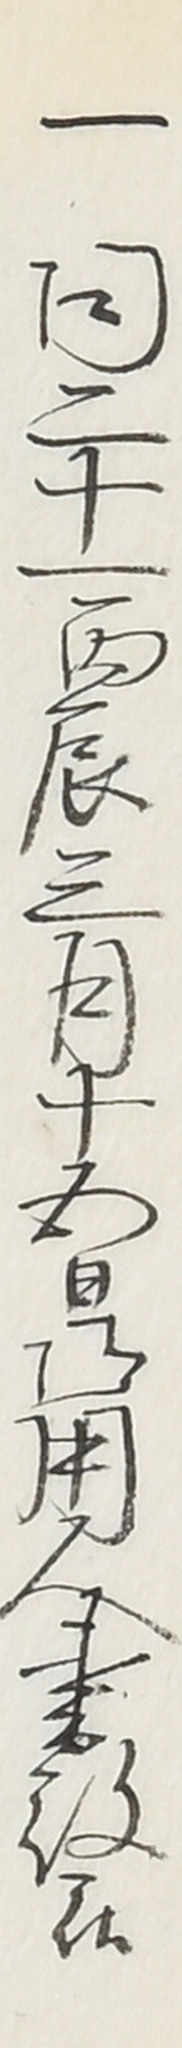一同二十一丙辰三月十五日御用人書役被
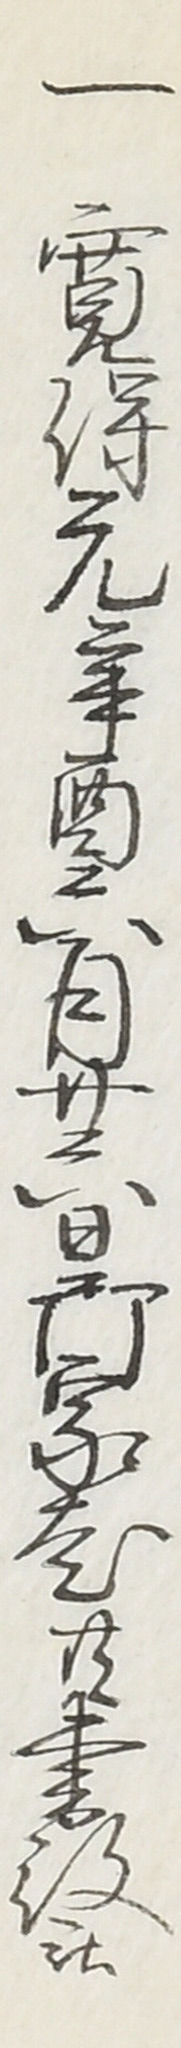一寛保元辛酉六月廿六日御家老共書役被
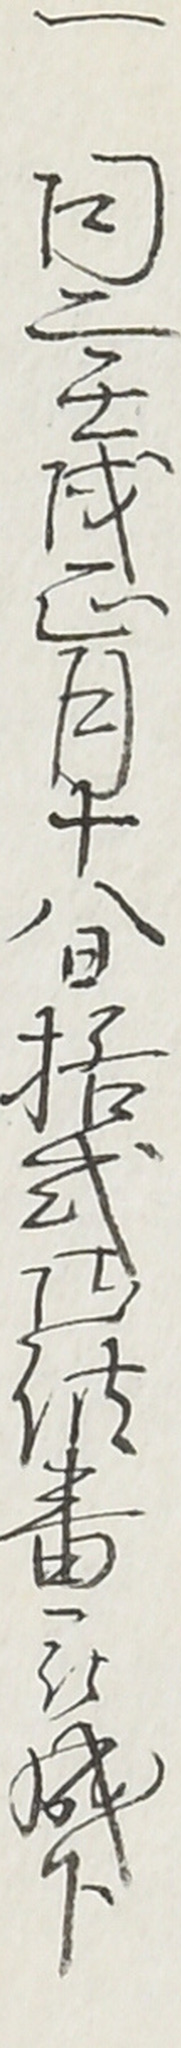一同二壬戌正月十八日格式御供番被成下
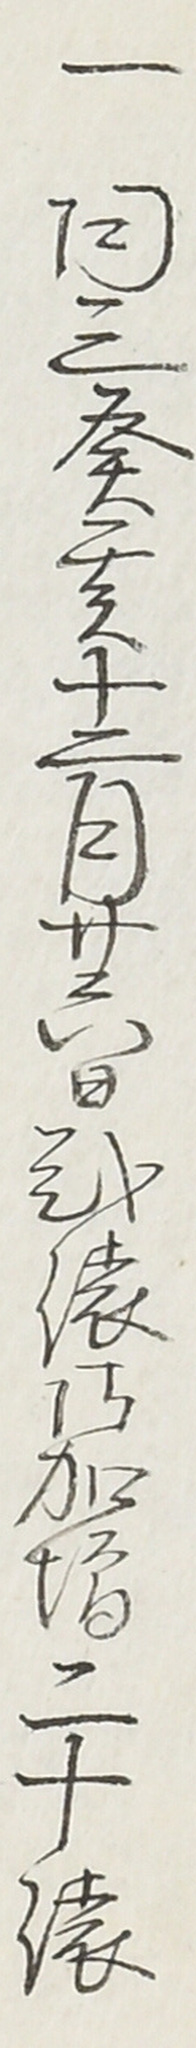一同三癸亥十二月廿六日弐俵御加増二十俵
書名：給人諸士勤仕録（七）
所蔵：伊那市立高遠町図書館・合同会社AMANE
